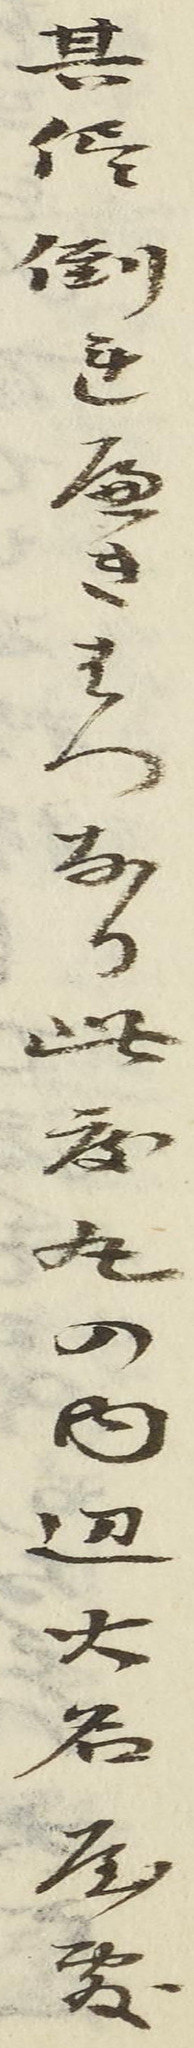その儘倒れへきはつなり此度丸の内辺大名屋敷
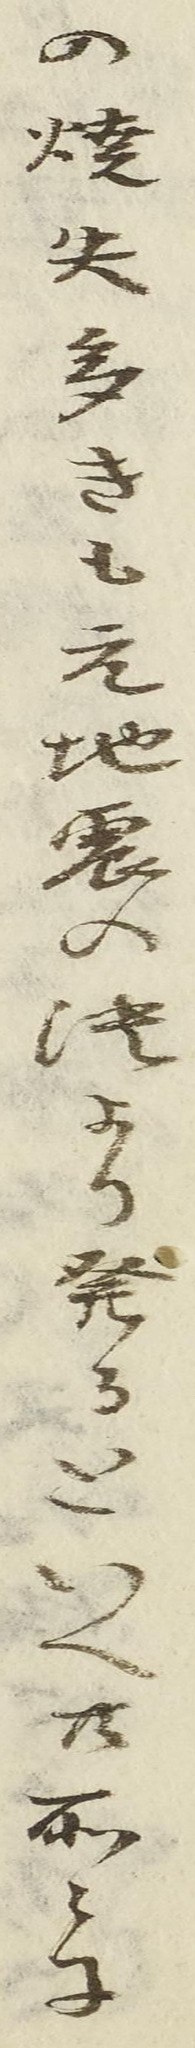の焼失多きも元地震の潰より発るといへ共所々に
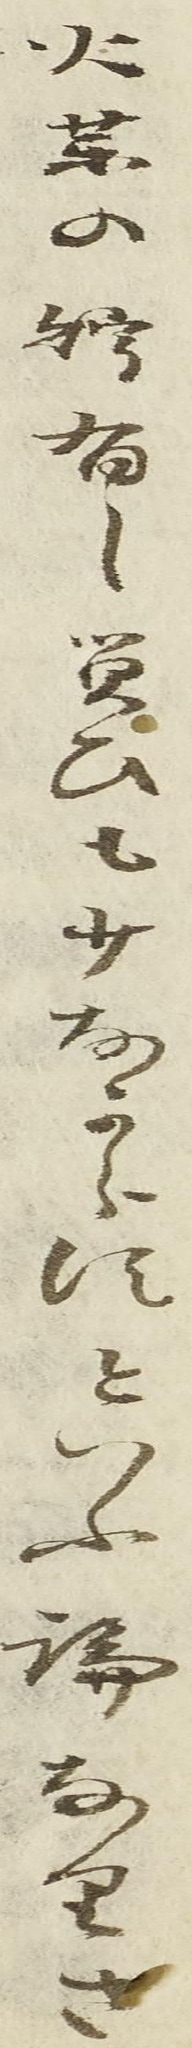火薬の貯有し災ひも少なからすといふ論なりさ
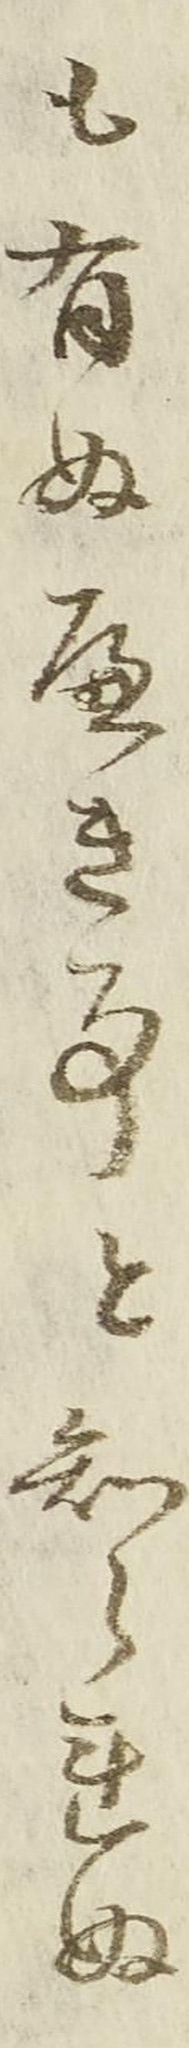も有ぬへき事と知られぬ

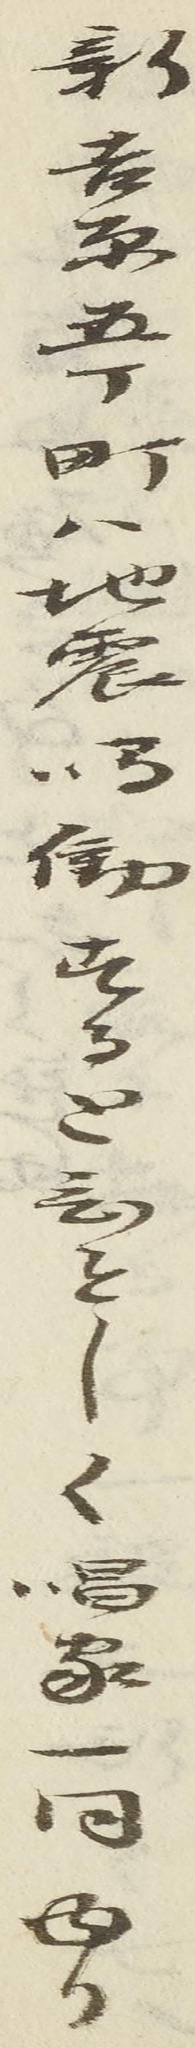新吉原五丁町ハ地震鳴動するとひとしく娼家一同ゆり
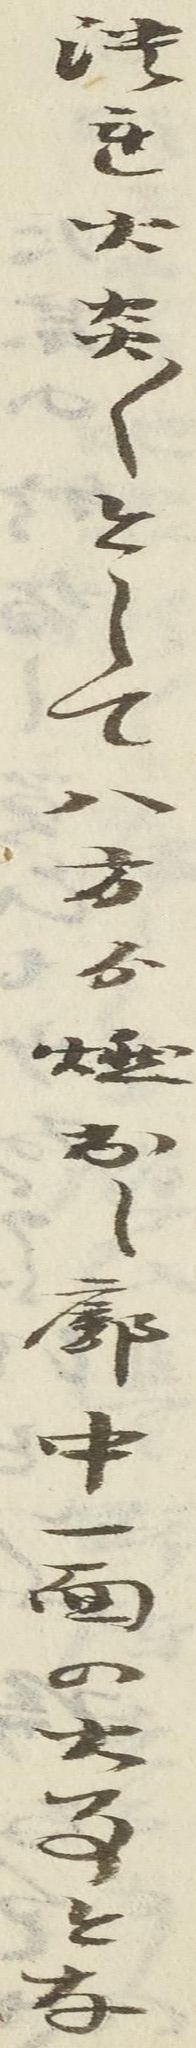潰れ火災〳〵として八方ゟ燃出し廓中一面の大火とな
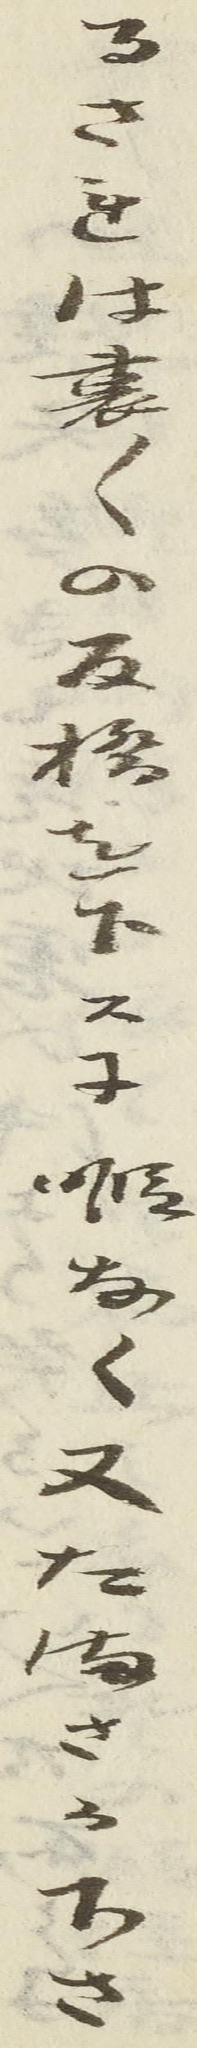るされは裏々の反橋を下ㇲに暇なく又たまさか下さ
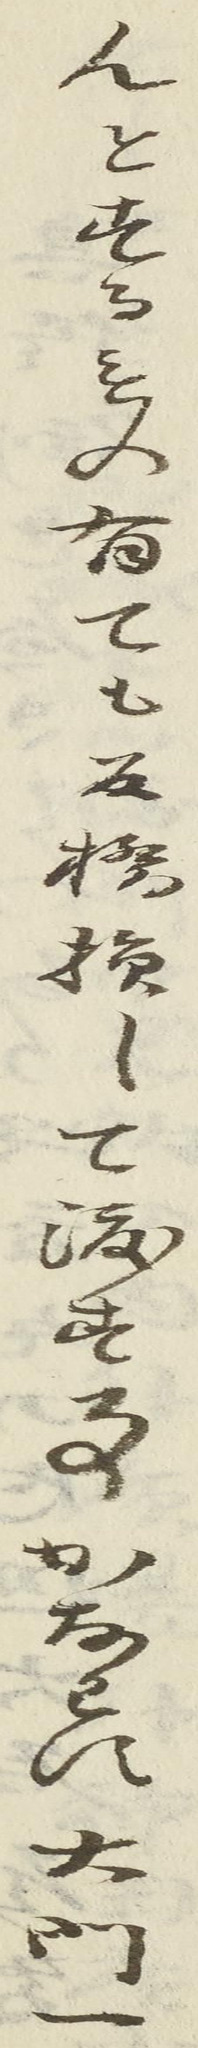んとするもの有ても反橋損して渡す事かなわす大門一
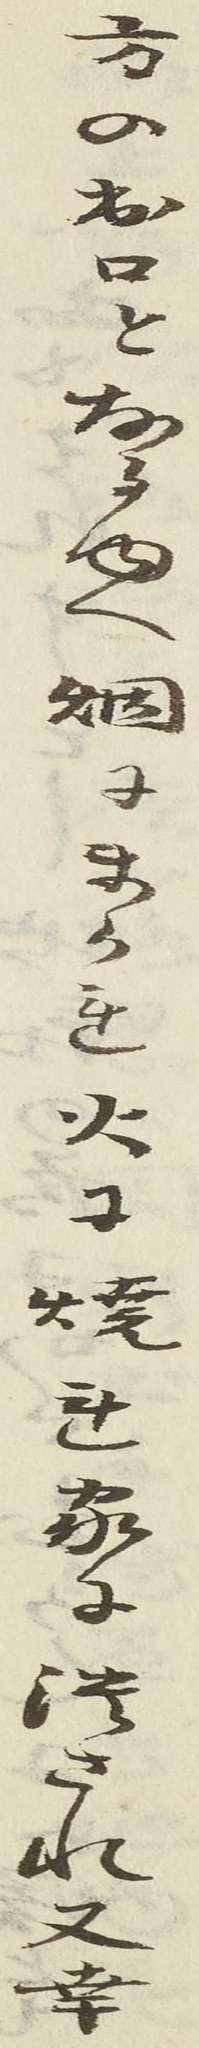方の出口となるゆへ烟にまかれ火に焼れ家に潰され又幸
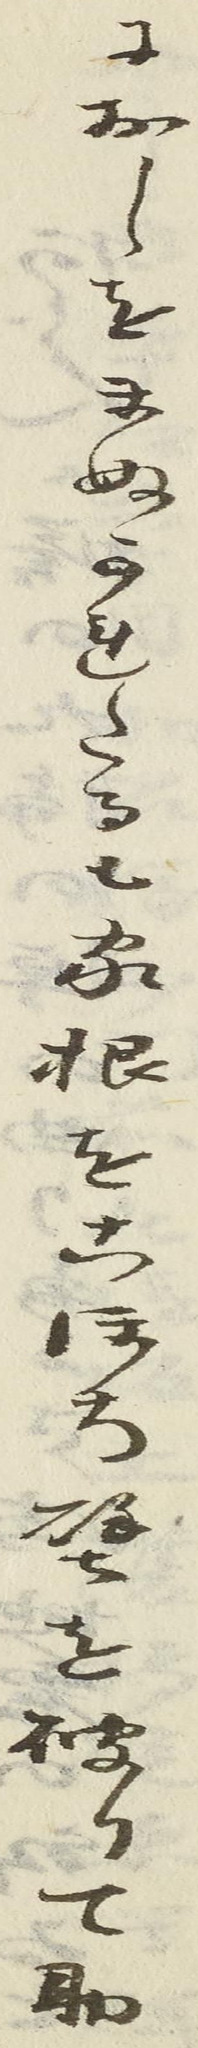におしをまぬかれたるも家根をこほち壁を破りて助
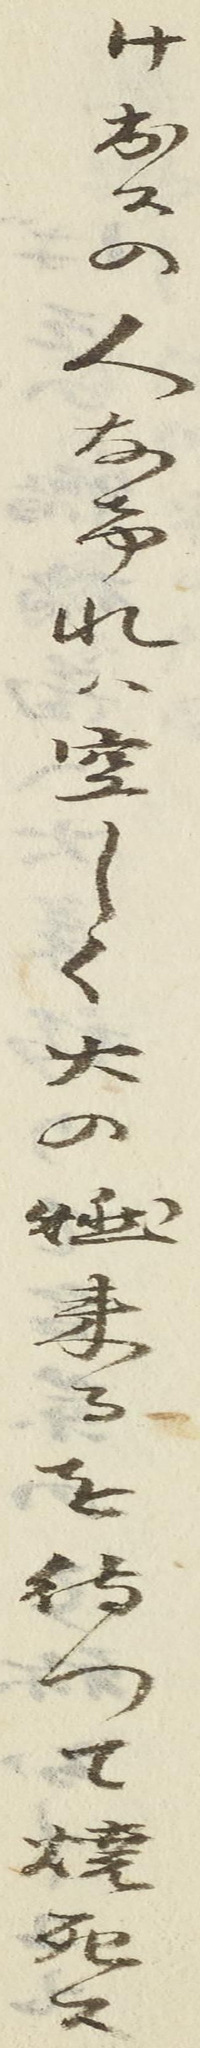け出ㇲの人なけれハ空しく火の燃来るを待つて焼死ㇲ
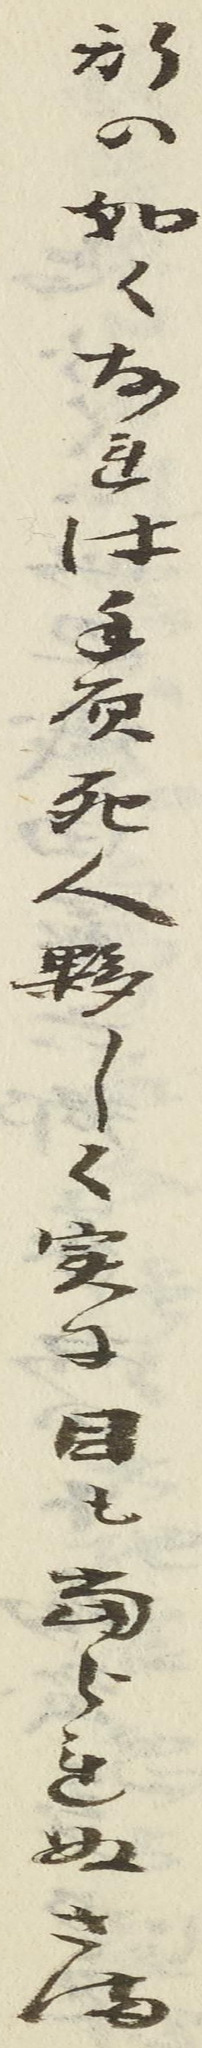斯の如くなれは手負死人夥しく実に目も当られぬさま
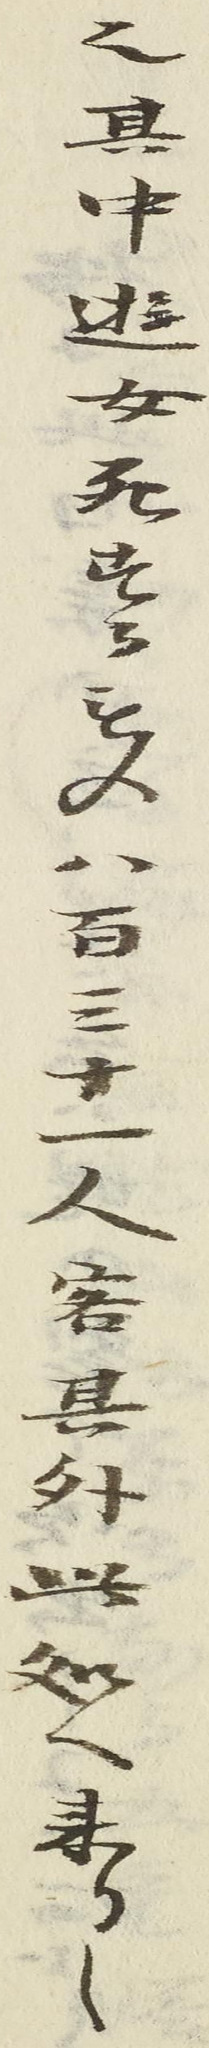也其中遊女死するもの八百三十一人客其外此処へ来りし
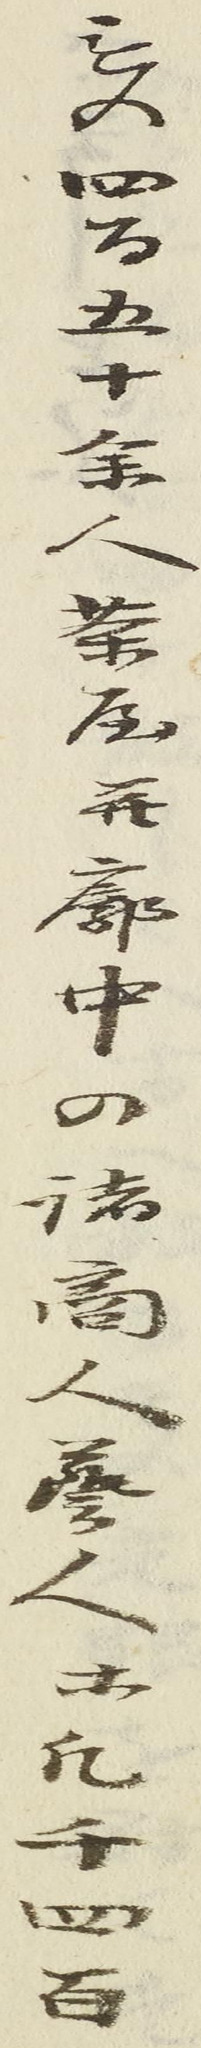もの四百五十余人茶屋并廓中の諸商人芸人等凡千四百
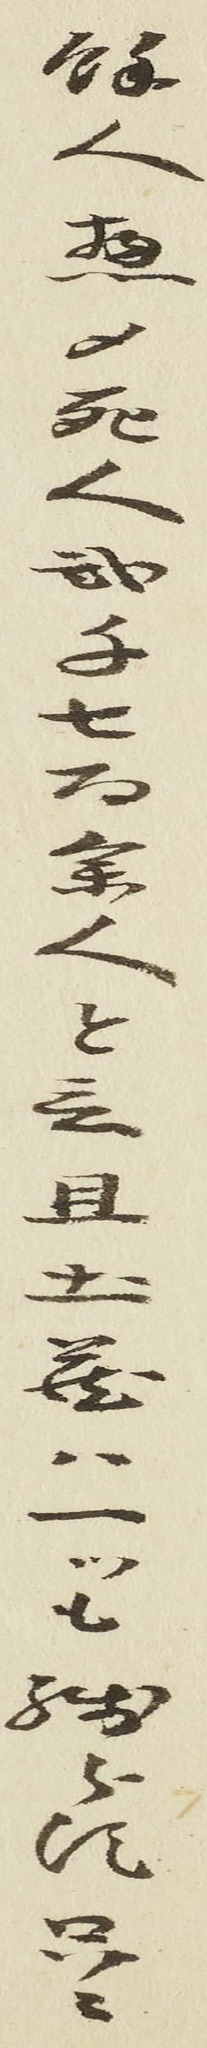余人惣〆死人弐千七百余人と云且土蔵ハ一ッも残らす只々
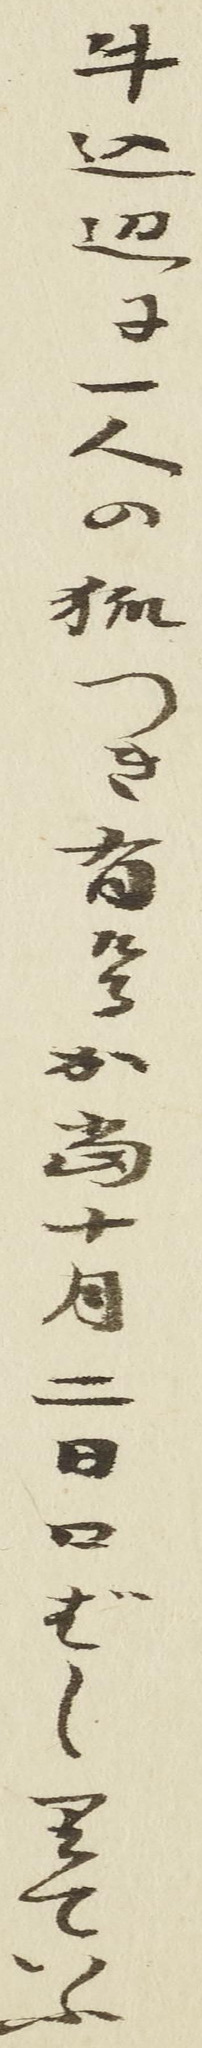牛込辺に一人の狐つき有けるか当十月二日口ばしりていふ
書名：那為の後見艸　全
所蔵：東京大学地震研究所図書室 Earthquake Research Institute Library, The University of Tokyo, JAPAN
